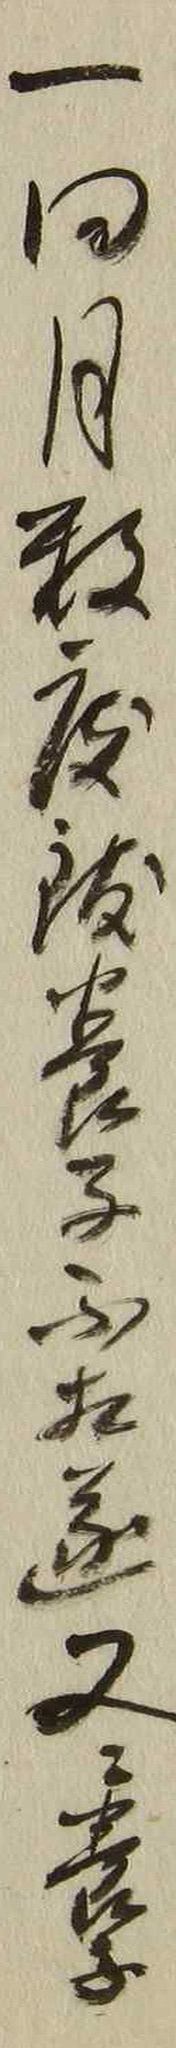一同月数度致養子不相遂又ニ養子
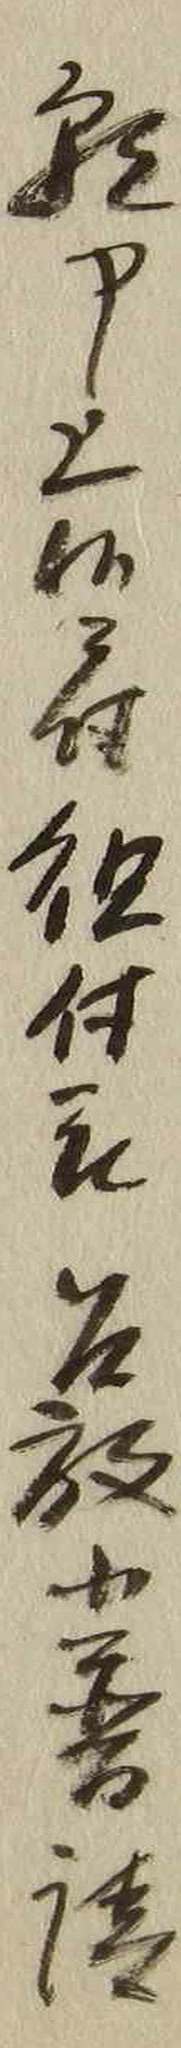願申上候ニ付組付被召放小普請
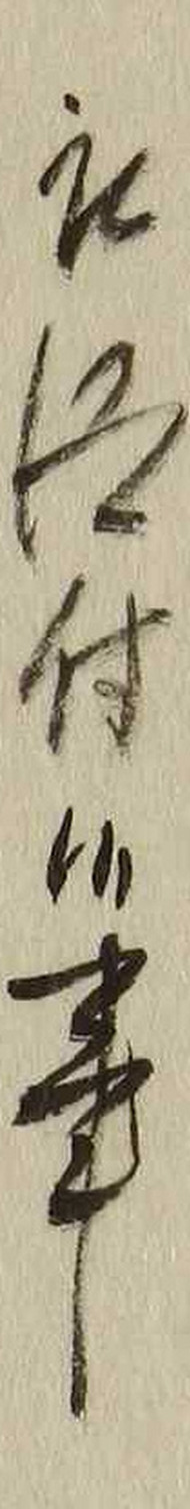被仰付候事
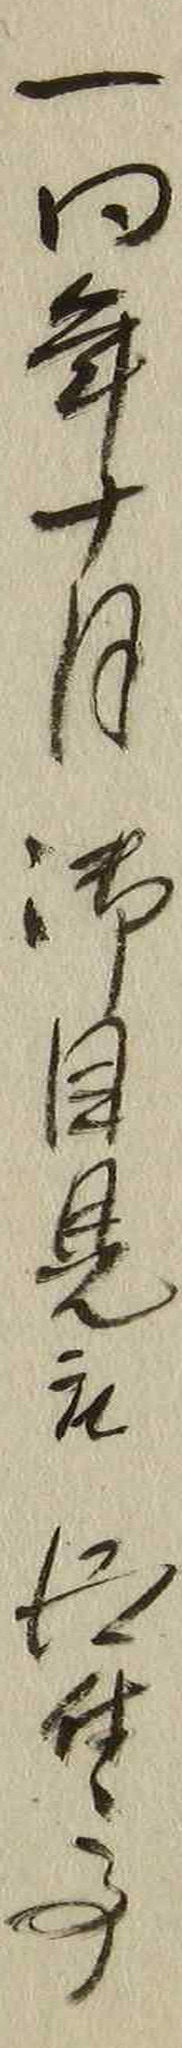一同年十月御目見被仰付候事
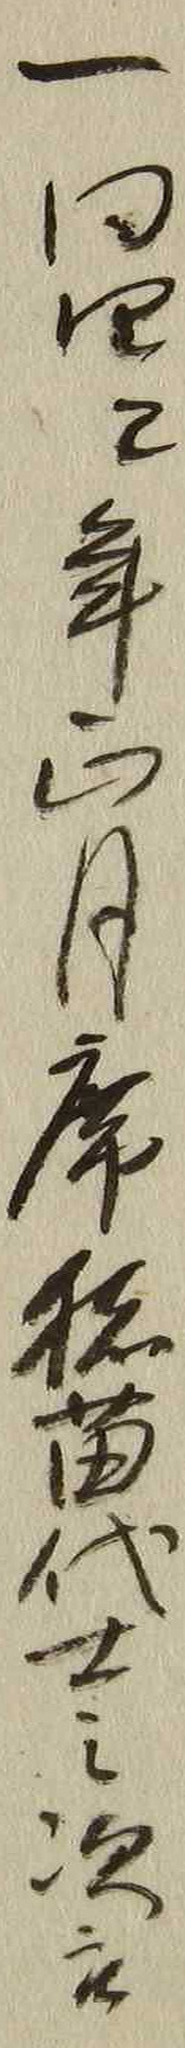一同四巳年正月席猪苗代士之次被
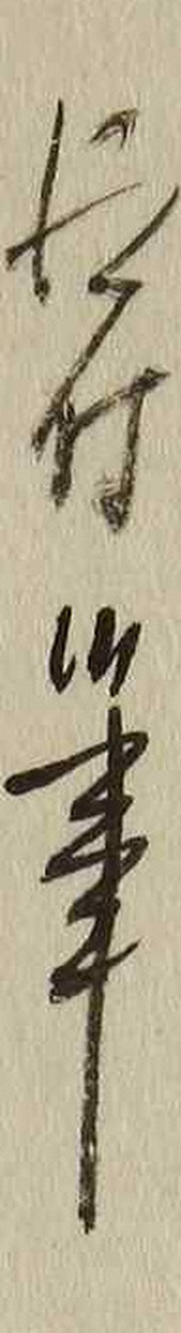仰付候事
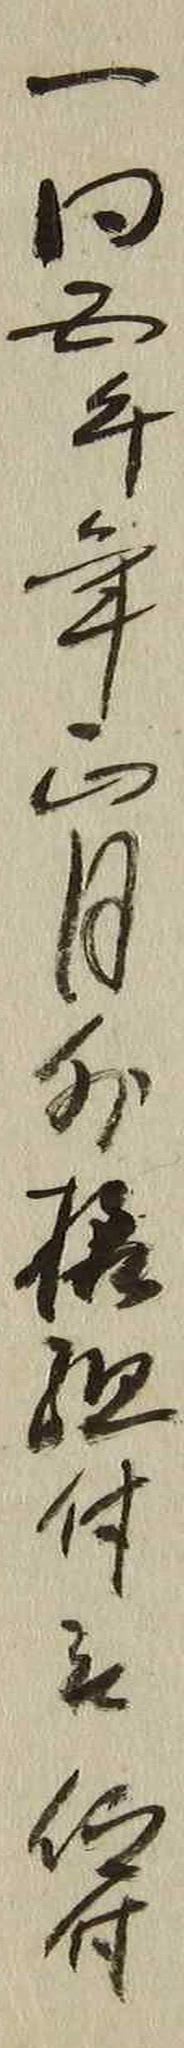一同五午年正月外様組付被仰付
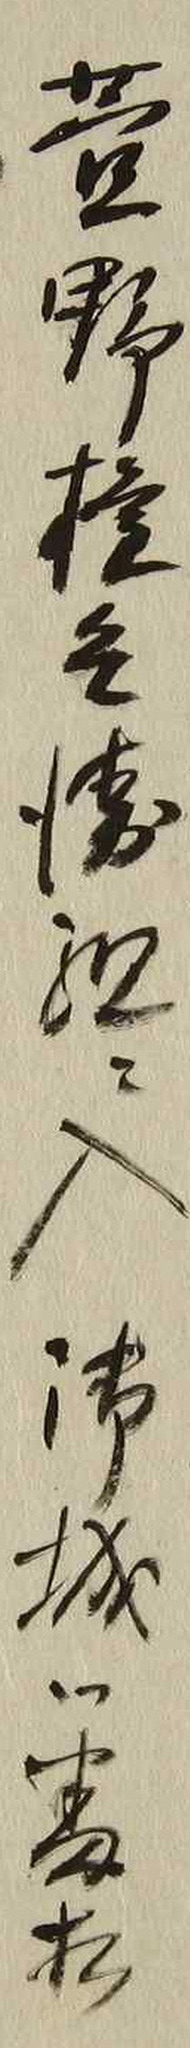萱野権兵衛組ニ入御誠御番相
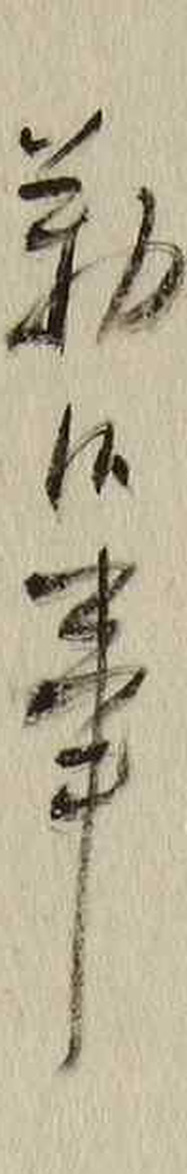勤候事
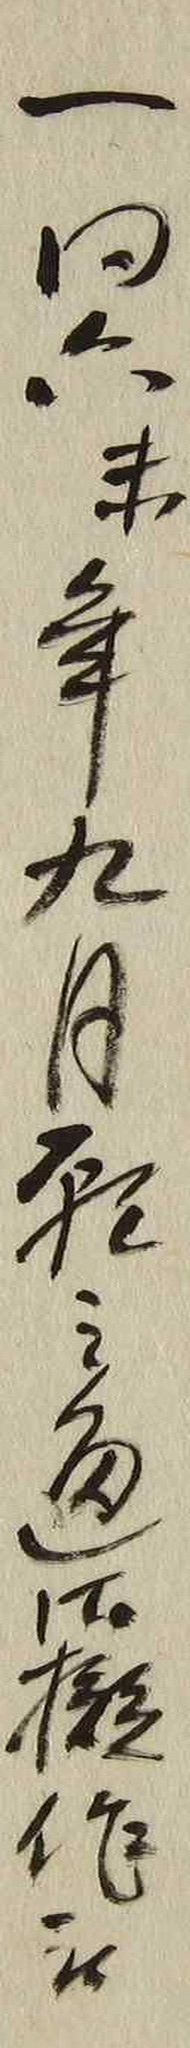一同六未年九月願之通御擬作被
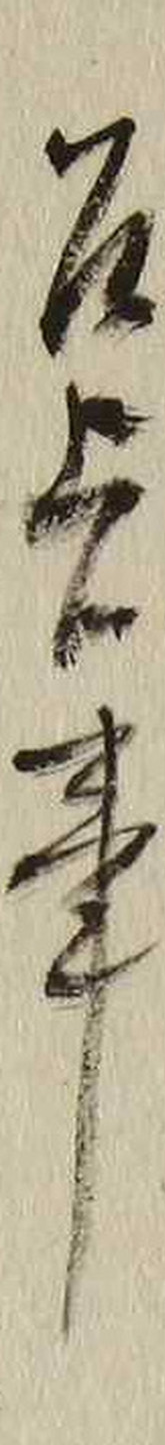召上候事
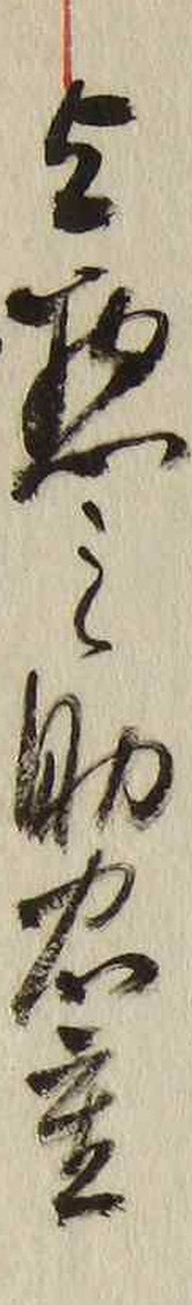与惣之助忠重
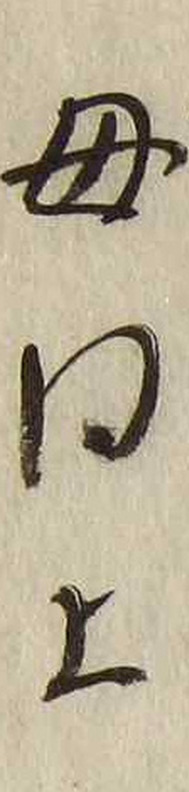母同上

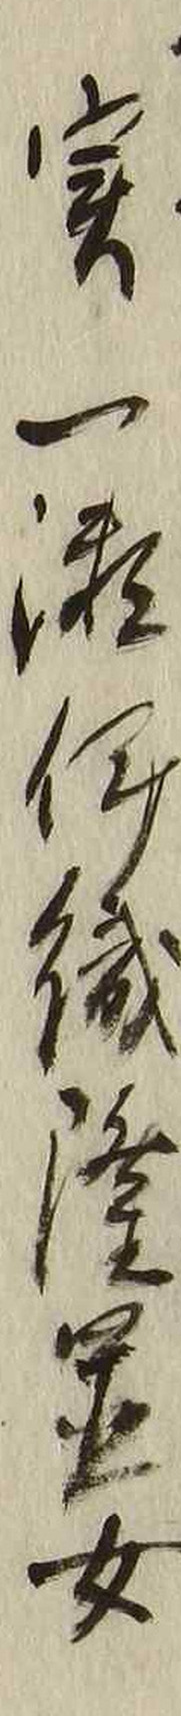実一瀬伊織隆置女
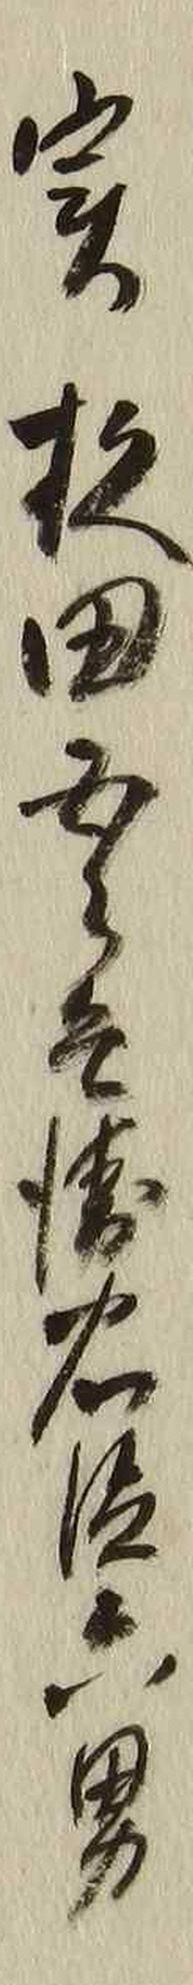実杉田五郎兵衛勝忠六男
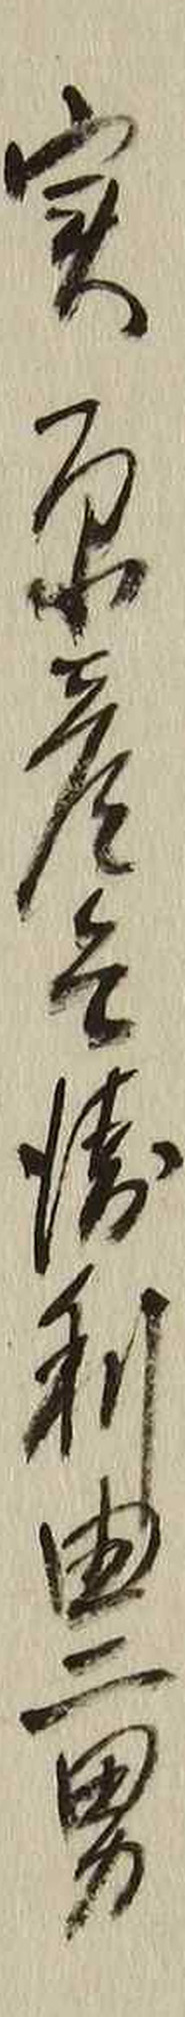実原彦兵衛利由二男
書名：諸士系譜　巻之359　す之部9
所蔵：会津若松市立会津図書館
